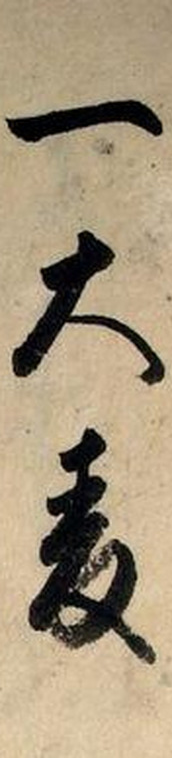一大麦
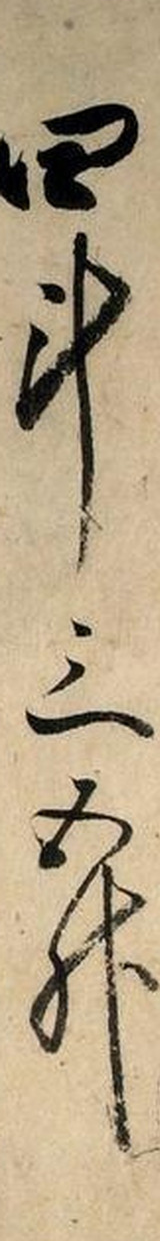四斗三五升
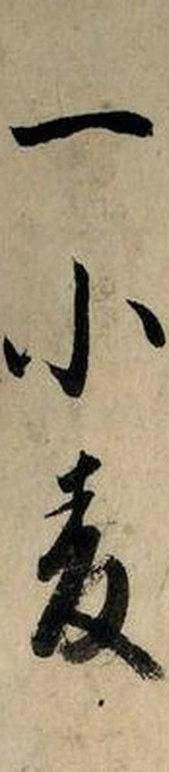一小麦
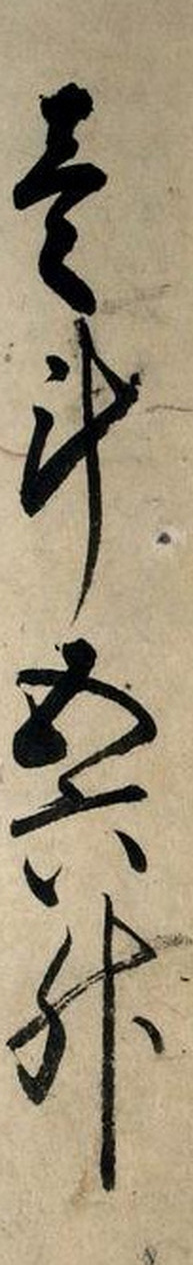壱斗五六升
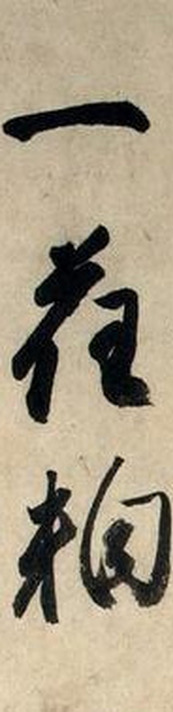一荏粕

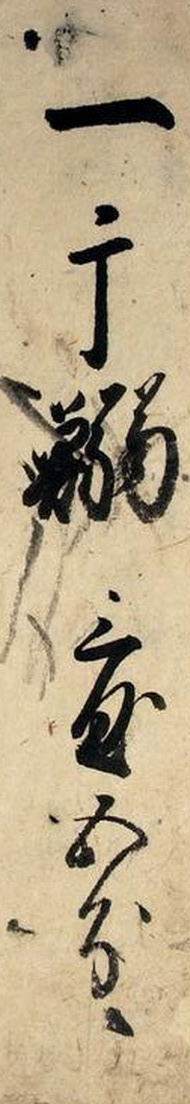一干鰯三匁五分
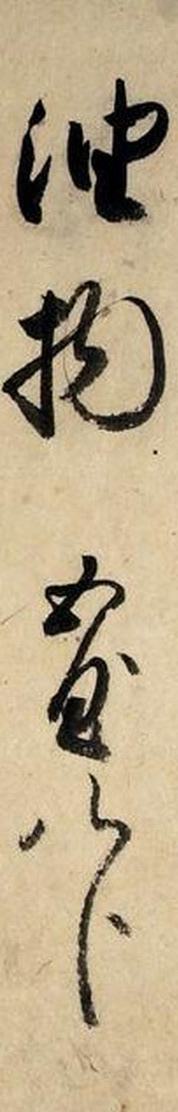油物五匁八分
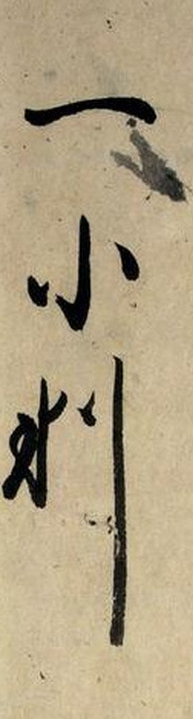一小判
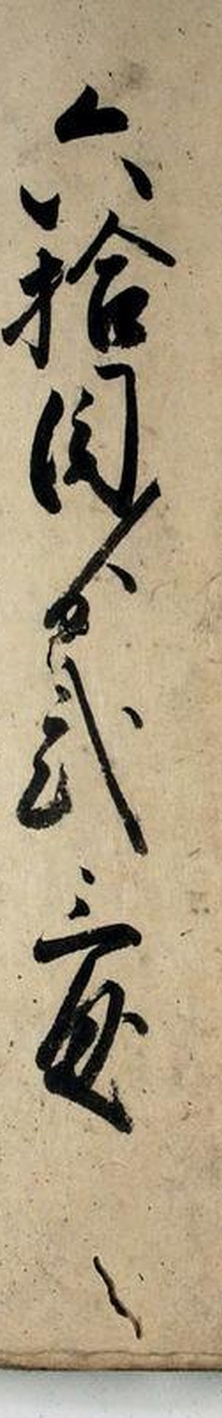六拾目ゟ弐三匁
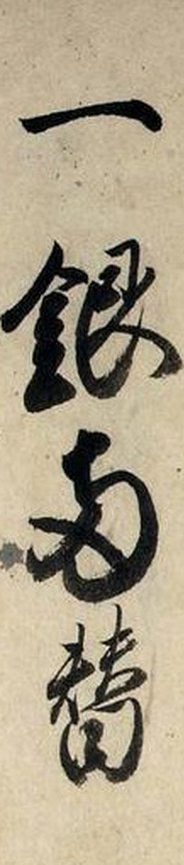一銀両替
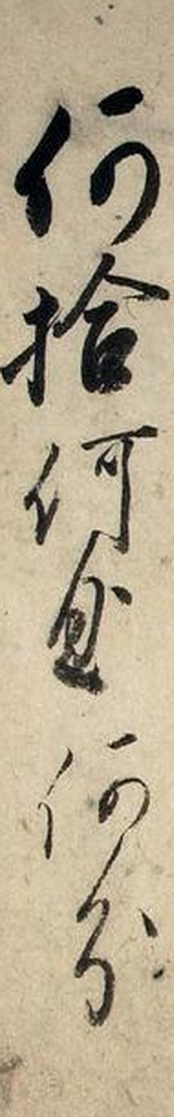何拾何匁何分

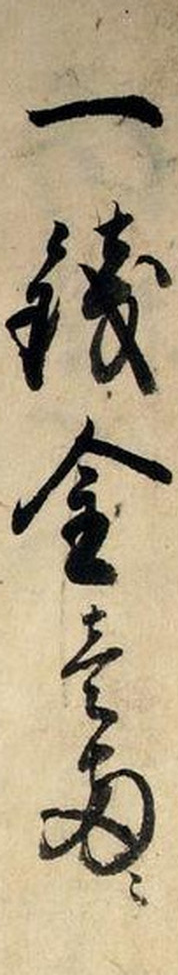一銭金壱両に
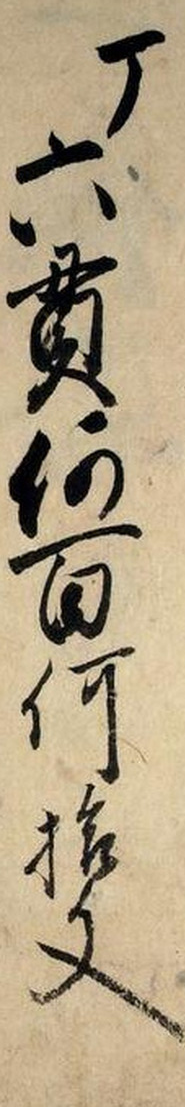丁六貫何百何拾文
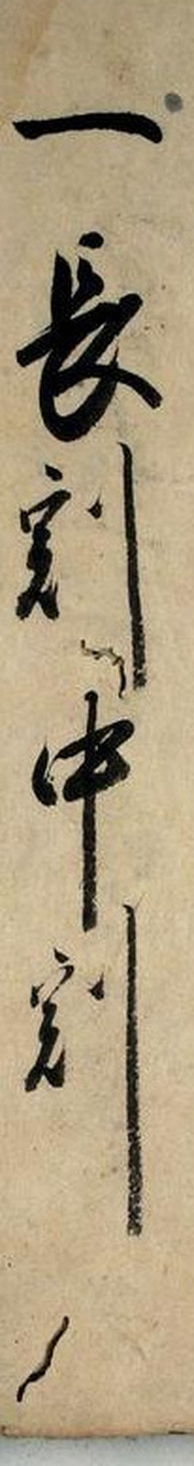一長割中割
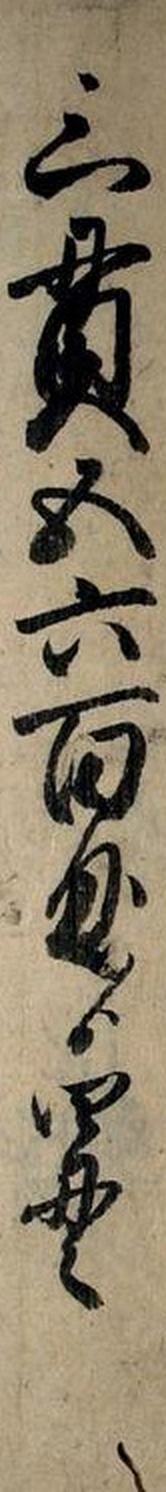三貫五六匁ゟ四貫
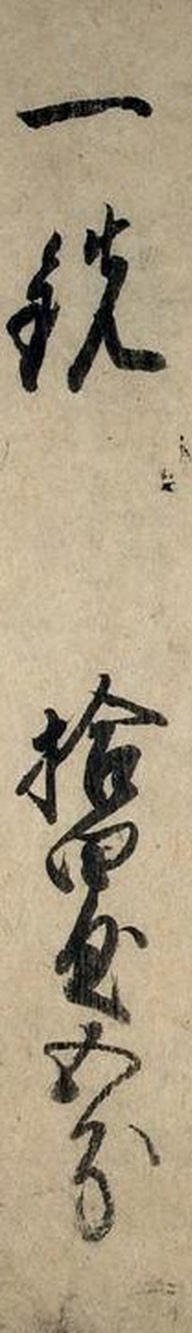一鉄拾四匁五分
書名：御手本（手習、いろは・数字、「名頭之事」「親戚字尽」「相庭之…
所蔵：福井県文書館 Fukui Prefectural Archives
